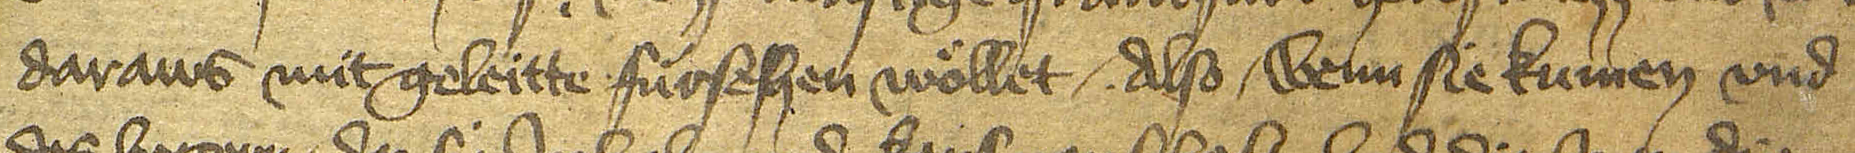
daraws mit geleitte fürſehen wöllet / . Alſo / wenn ſie kumen vnd
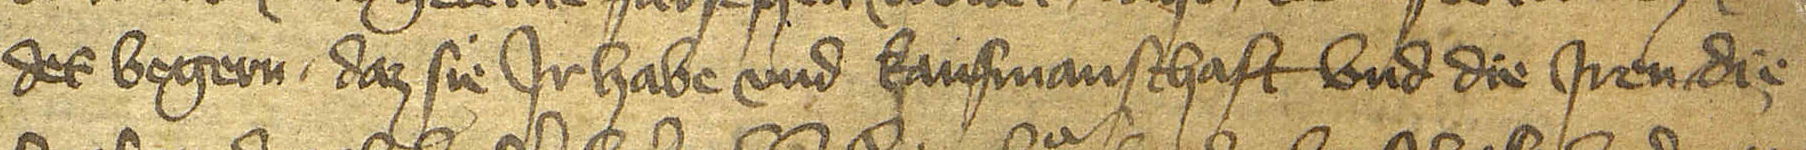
des begern / daʒ ſie Ir habe vnd kaufmanſchaft vnd die Iren / die
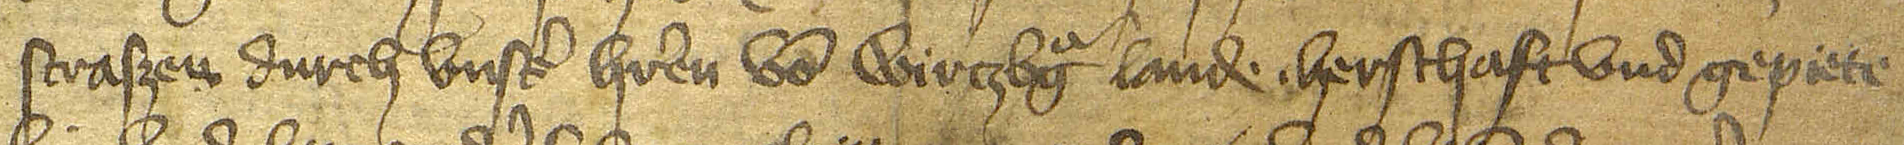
ſtraſʒen durch vnſs* hr*en vo* Wircʒbg* lande . herſchaft vnd gepiete
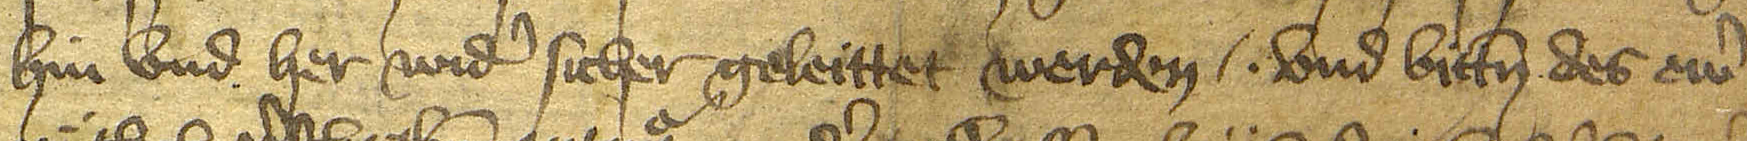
hin vnd her wid* ſicher geleittet werden / . vnd bittn* des ew*
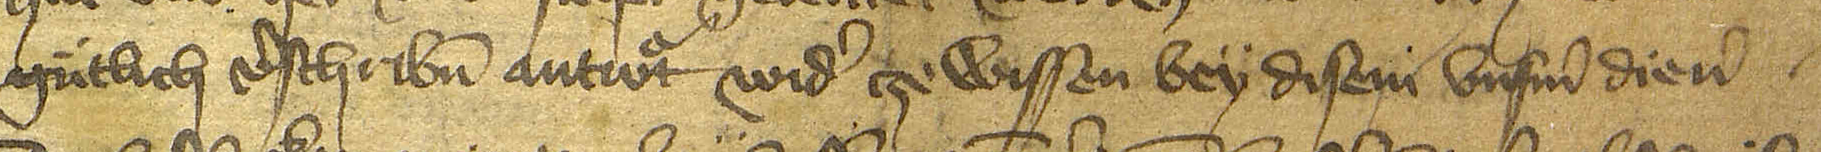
gütlich v*ſchribn* antw*t wid* cʒe wiſſen bey diſem vnſm* dien*
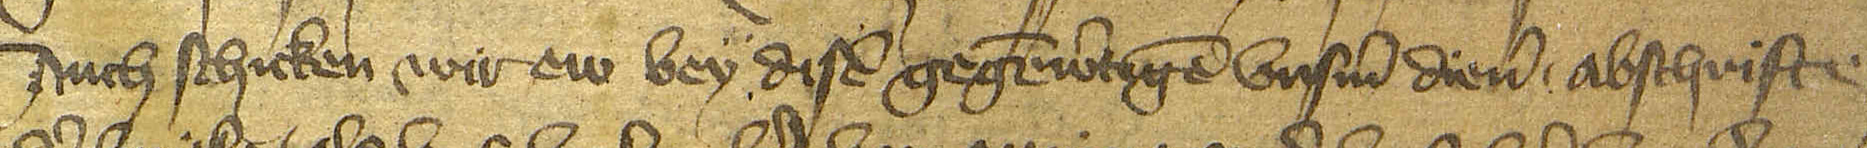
Auch ſchicken wir ew bey diſe* gege*w*tige* vnſm* dien* / abſchrifte
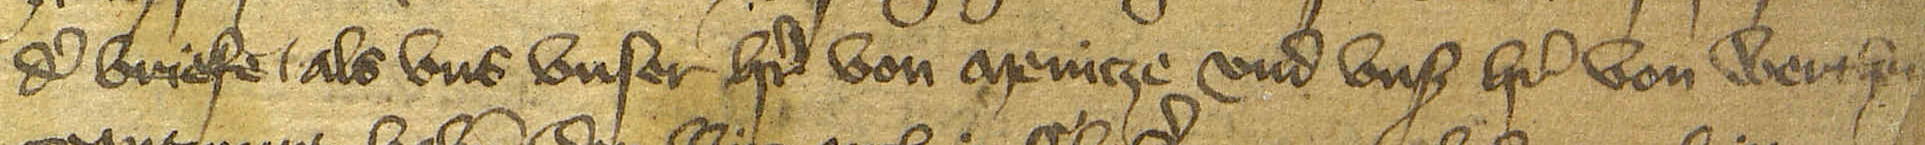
d* briefe / als vns vnſer hr* von Meincʒe vnd vnſ* hr* von Werthei%
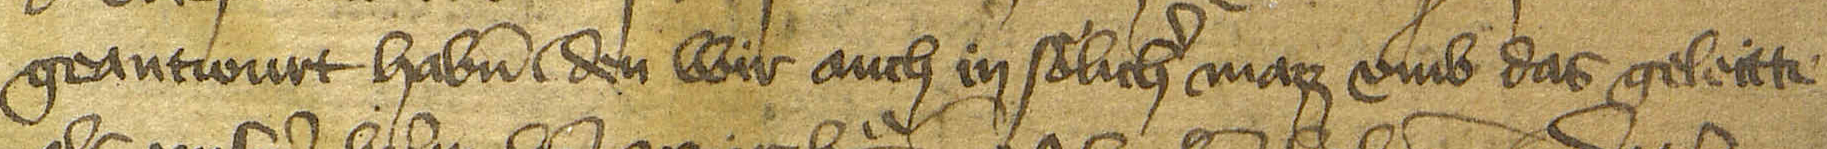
geantwurt habn* / den wir auch in ſölich* maʒʒ vmb das geleitte
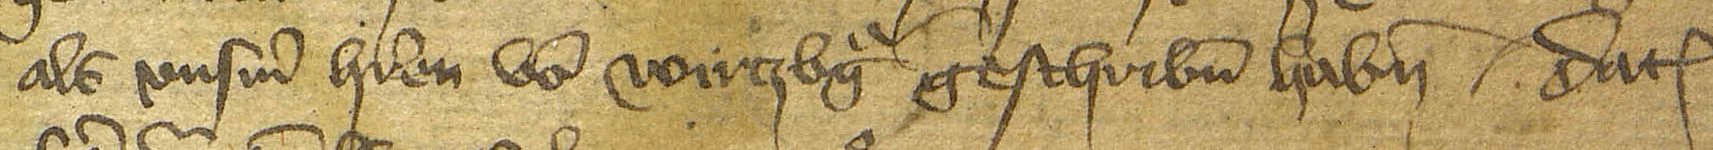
als vnſm* hr*en vo* wircʒbg* geſchribn* habn* / Dat*
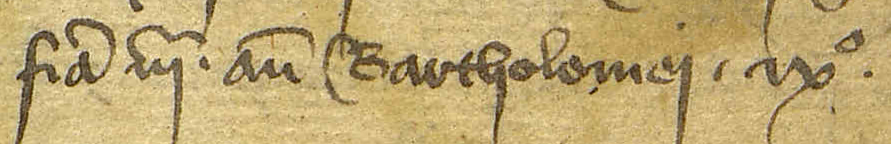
fia* iii* . an* Bartholomei / ix* .
